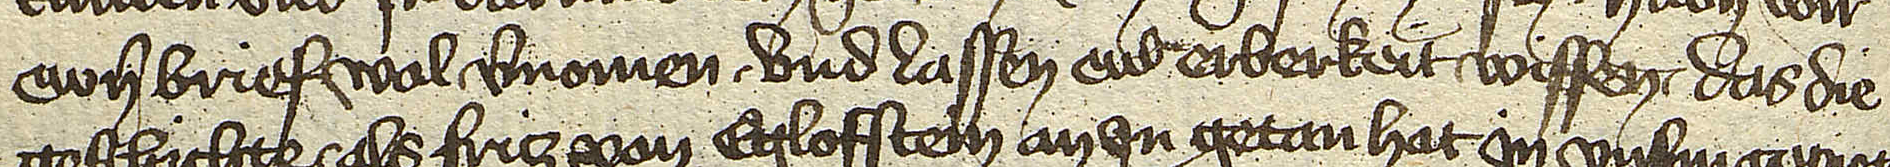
ewn* brief wol v*nomen / vnd laſſen ew* erberkeit wiſſen / das die
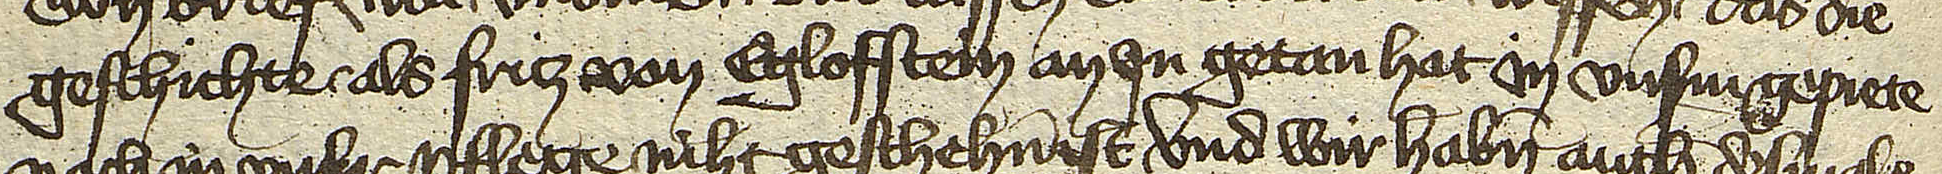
geſchichte / als fricʒ von Eglofſtein an In getan het an vnſ*m gepiete
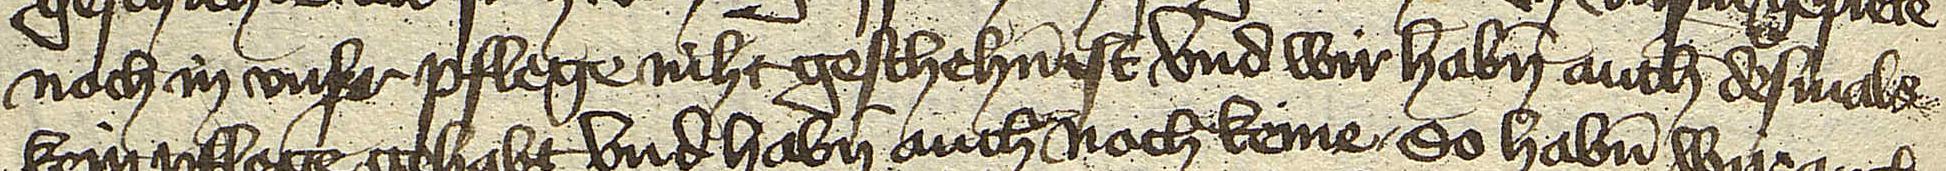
noch in vnſ*r pflege niht geſchehn* iſt / vnd wir habn* auch deſmals
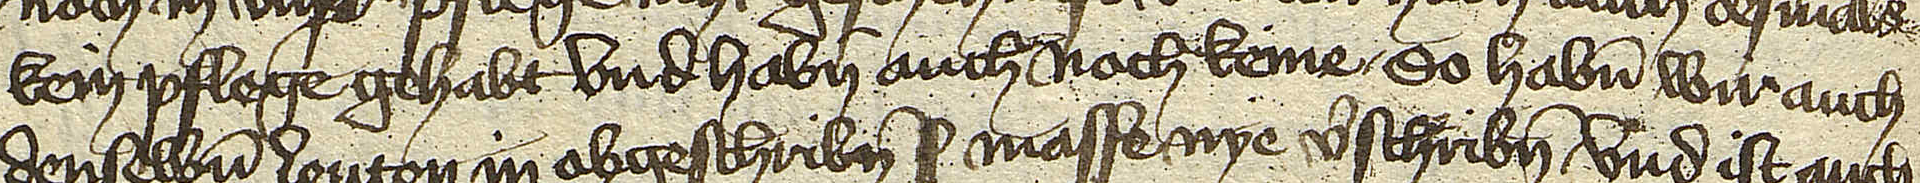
kein pflege gehabt vnd habn* auch noch keine / So habn* wir auch
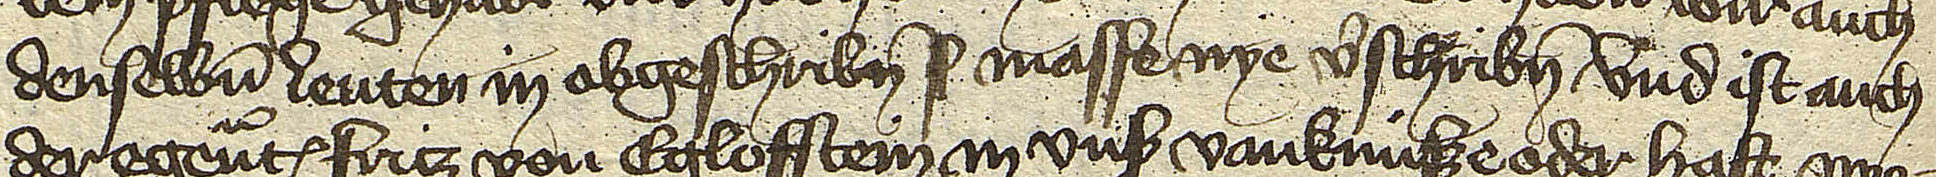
denſelbn* leuten in abgeſchribn* I maſſe nye v*ſchribn* / vnd iſt auch
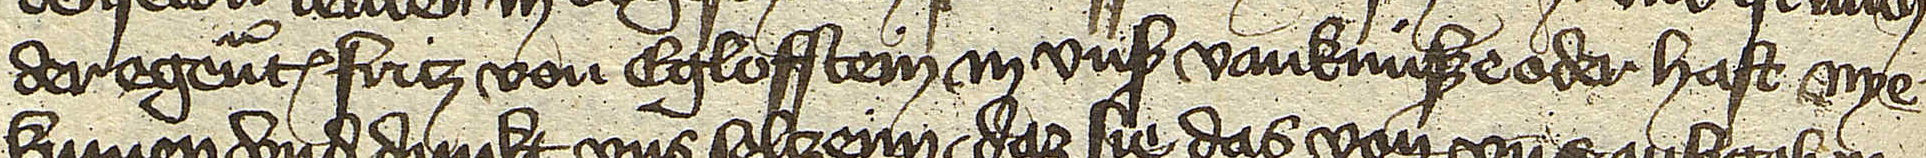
der egent* Fricʒ von Egolfſtein in vnſ* vanknüſʒe oder haft nye
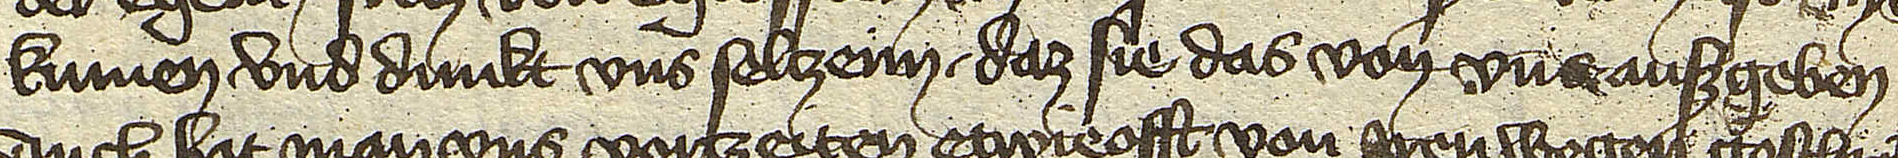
kumen / vnd dunkt vns ſelcʒeim / daʒ ſie das von vns auſʒgeben
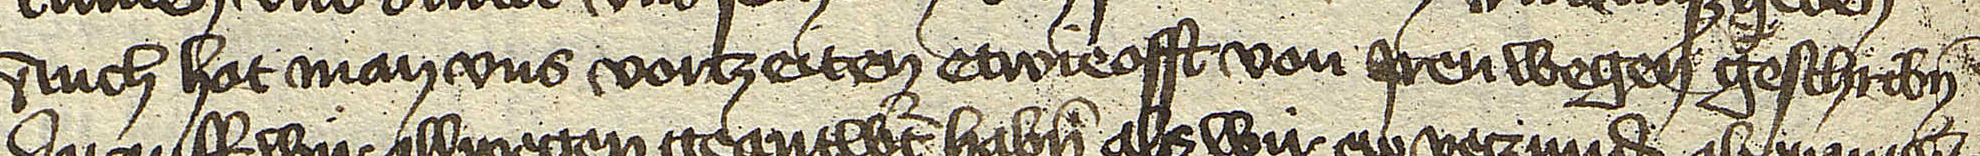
Auch hat man vns vorcʒeiten etwieofft von Iren wegen geſchribn*
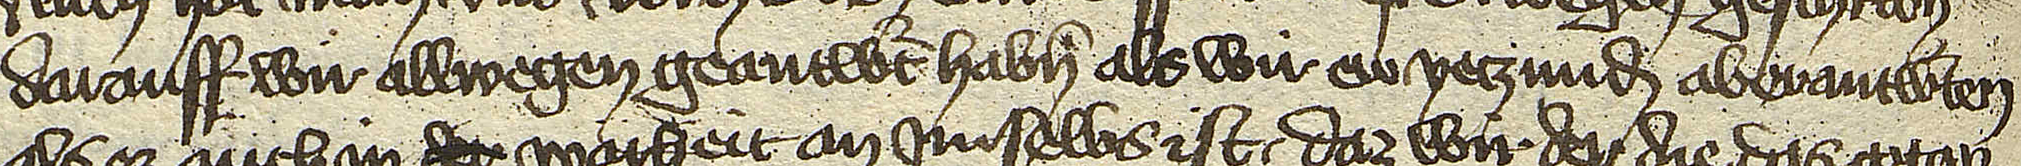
darauff wir allwegen geantwt* habn* als wir ew yecʒund aber antw*ten
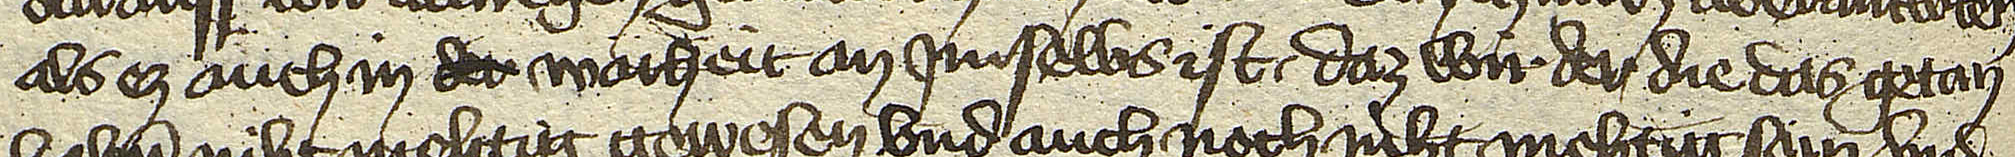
als eʒ auch in der warheit an Im ſelbs iſt / daʒ wir der die das getan
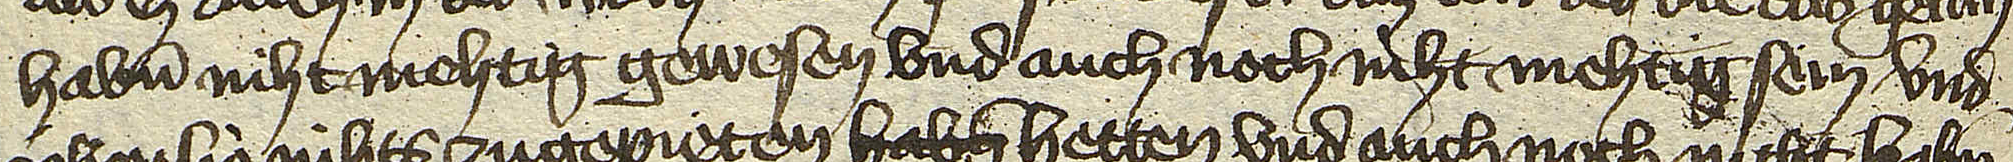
habn* niht mehtig geweſen vnd auch noch niht mehtig ſein / vnd
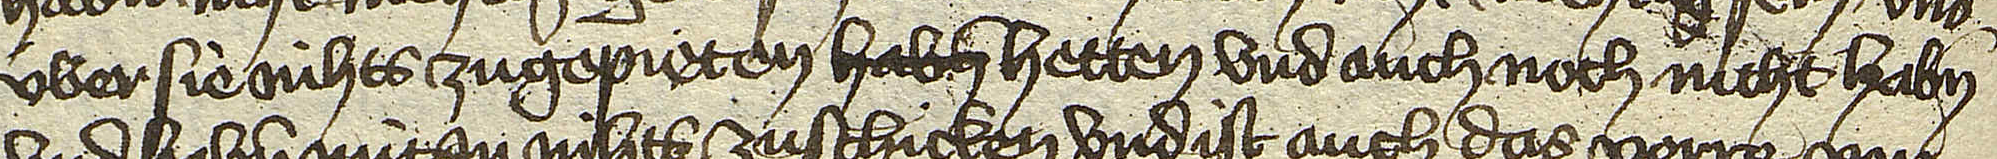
v̈ber ſie nihts cʒugepieten habn* hetten vnd auch noch nicht habn*
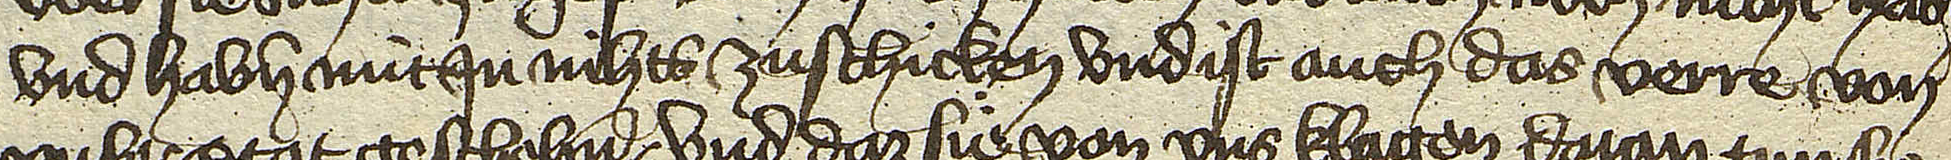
vnd habn* mit In nihts cʒuſchicken vnd iſt auch das verre von
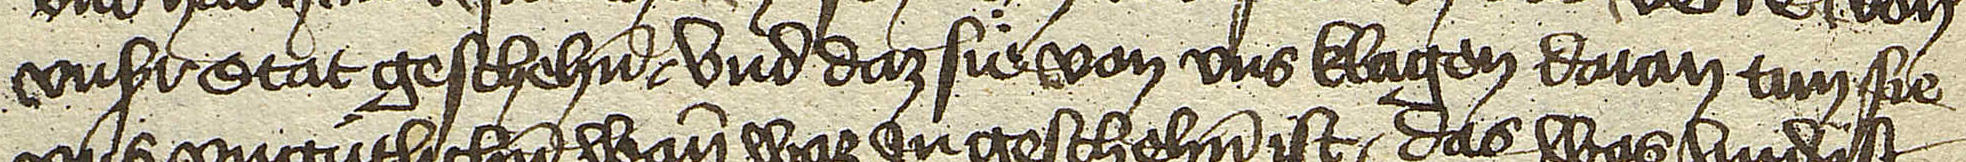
vnſ*r Stat geſchehn* / vnd daʒ ſie von vns klagen daran tun ſie
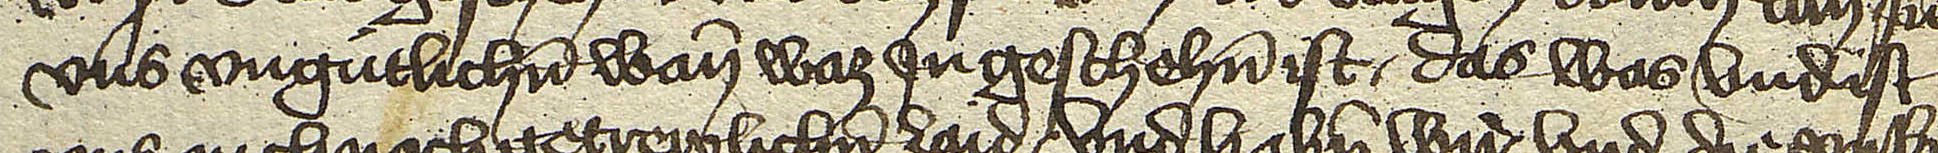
vns vngütlichn* wan* waʒ In geſchehn* iſt / das was vnd iſt
